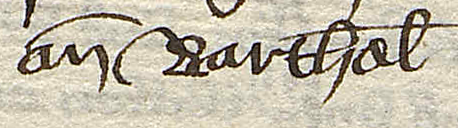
an* Barthol*
